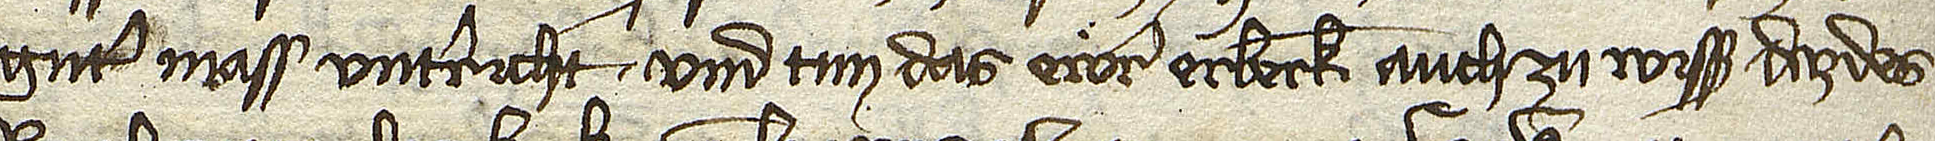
gut* maſſ vntr*icht / vnd tun das ewr* erberk* auch ʒu wiſſ* / daʒ des
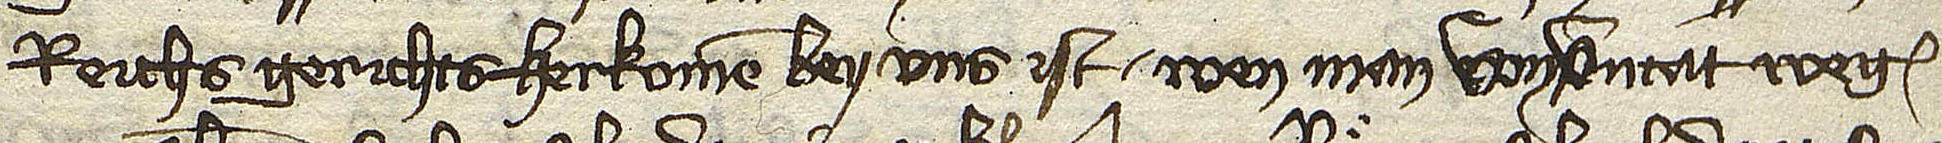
Reichs gerichts herkom*e bey vns ist / wen man Von Vntat weg*
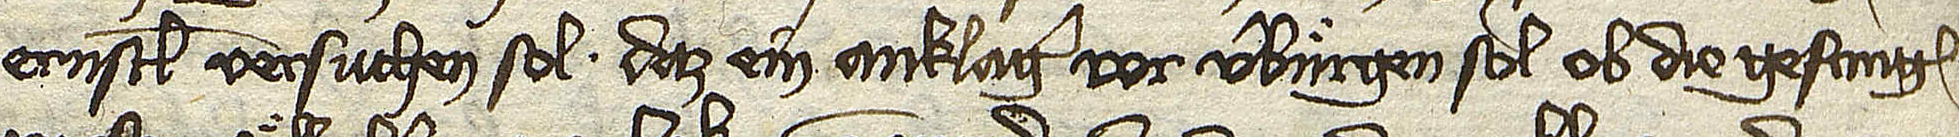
ernſtl* verſuchen ſol . daʒ ein anklag* vor v*bürgen ſol ob die geſang*
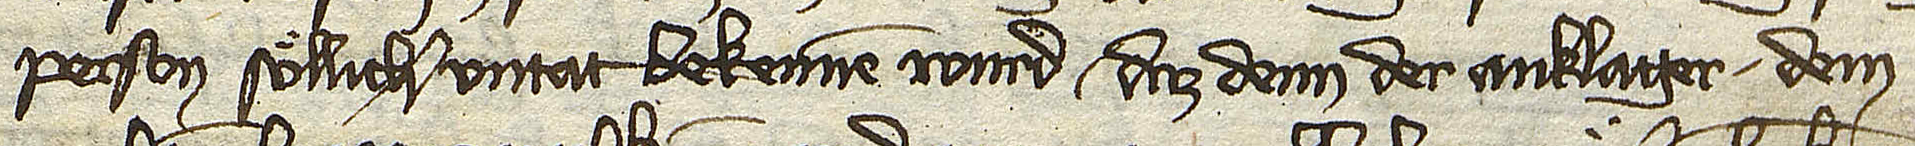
perſon ſöllich* vntat bekenne* wurd / daʒ denn der anklager / dem
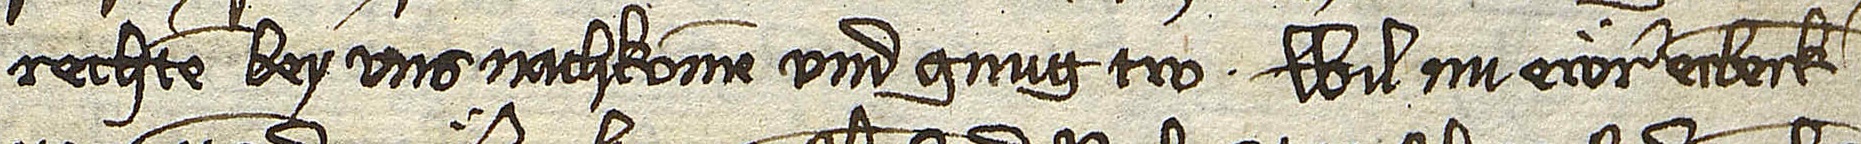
rechte* bey vns nachkome* vnd gnug tw . Wil nu ewr* erberk*
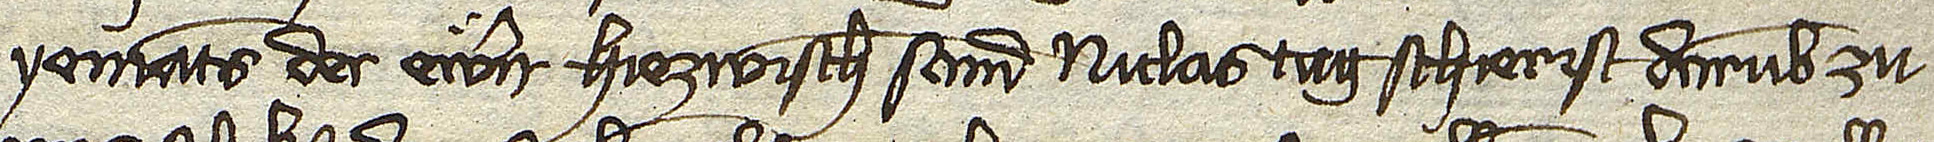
yemats* der ew*n hieʒwiſch* ſand Niclas tag ſchieriſt darub* ʒu
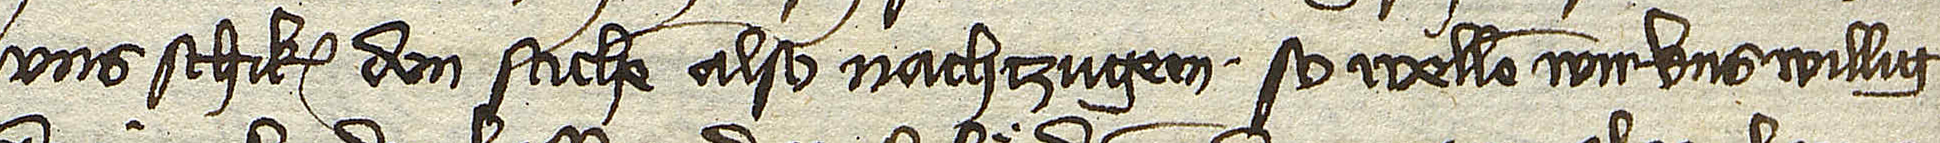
vns ſchik* den ſache* alſo nachʒugeen . ſo welle* wir vns willig
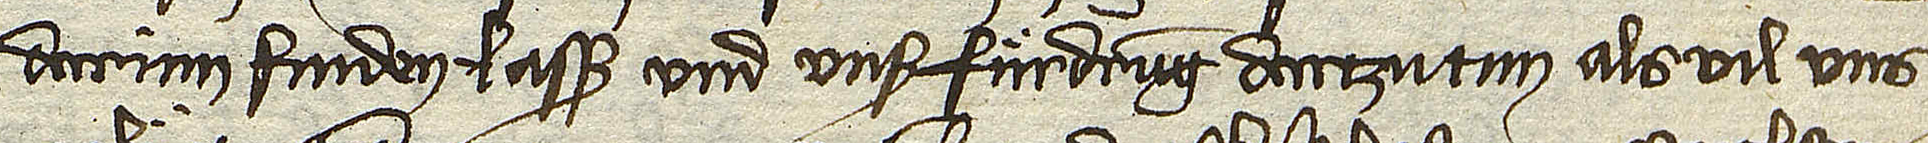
darinn finden laſſ* vnd vnſ* fürdrug* darcʒu tun als vil vns
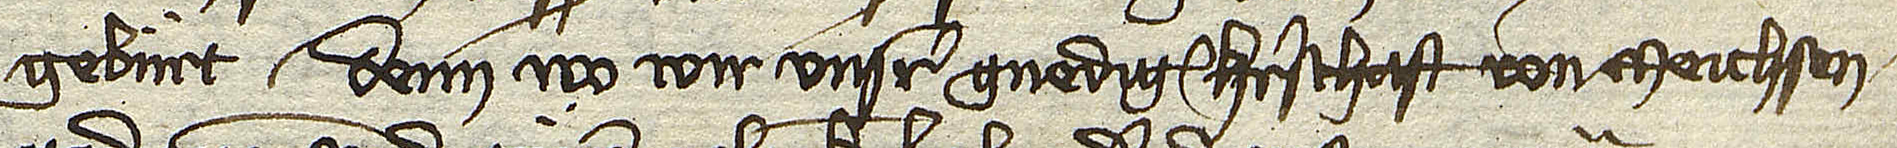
gebürt / Denn wo wir vnſr* gnedig* hr*schaft von Meichſen /
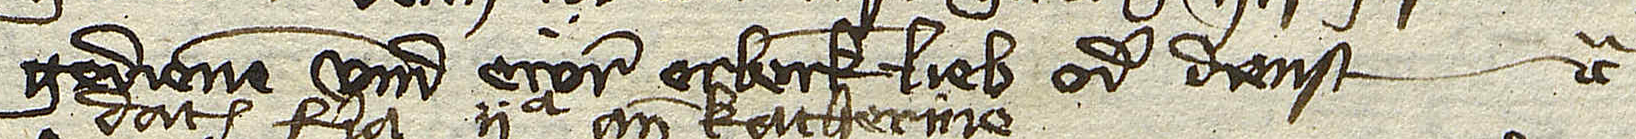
gediene* vnd ewr* erberk* lieb od* dienſt ec*
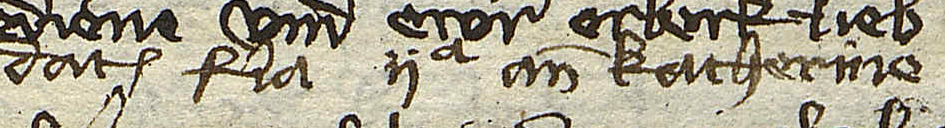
dat* fia* ii* an* katherine
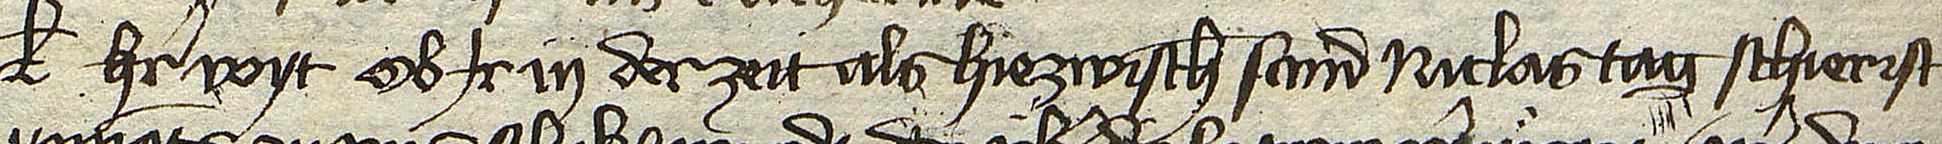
L* hr* vogt Ob Ir in der ʒeit als hieʒwiſch* ſand Niclas tag ſchieriſt
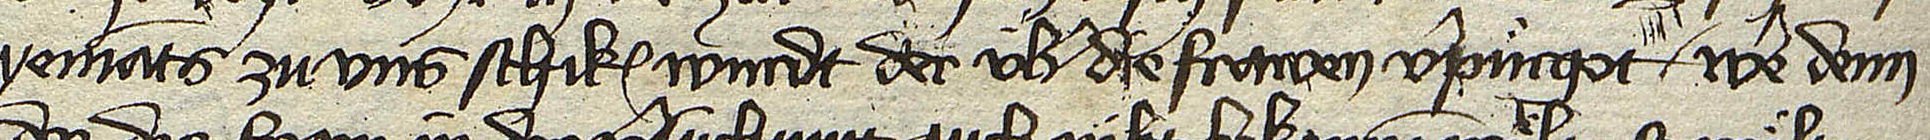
yemats* ʒu vns ſchik* wurdt der v̈b* die frawen v*pürgot / w*e denn
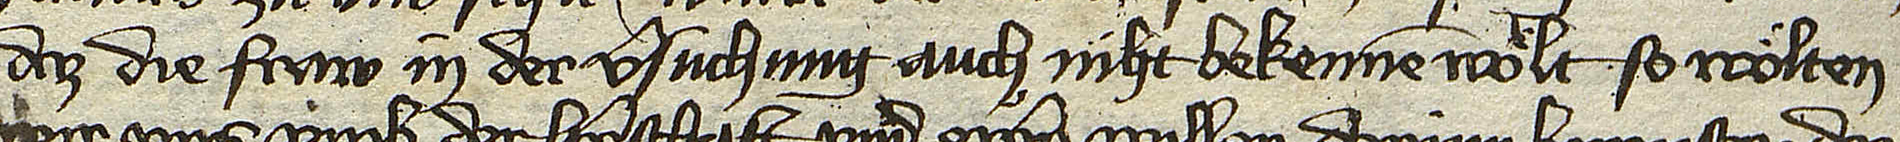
daʒ die fraw in der v*ſuchung auch niht bekenne* wölt . ſo wölten
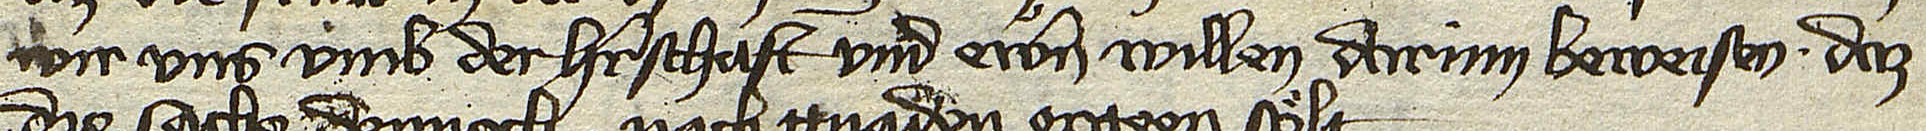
wir vns vmb der hr*ſchaft vnd ew*n willen darinn beweiſen . daʒ
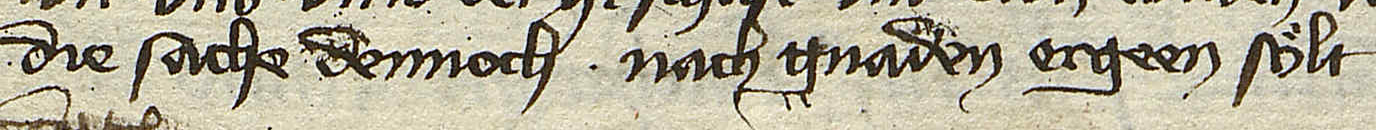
die ſache dennoch . nach gnaden ergeen ſölt
